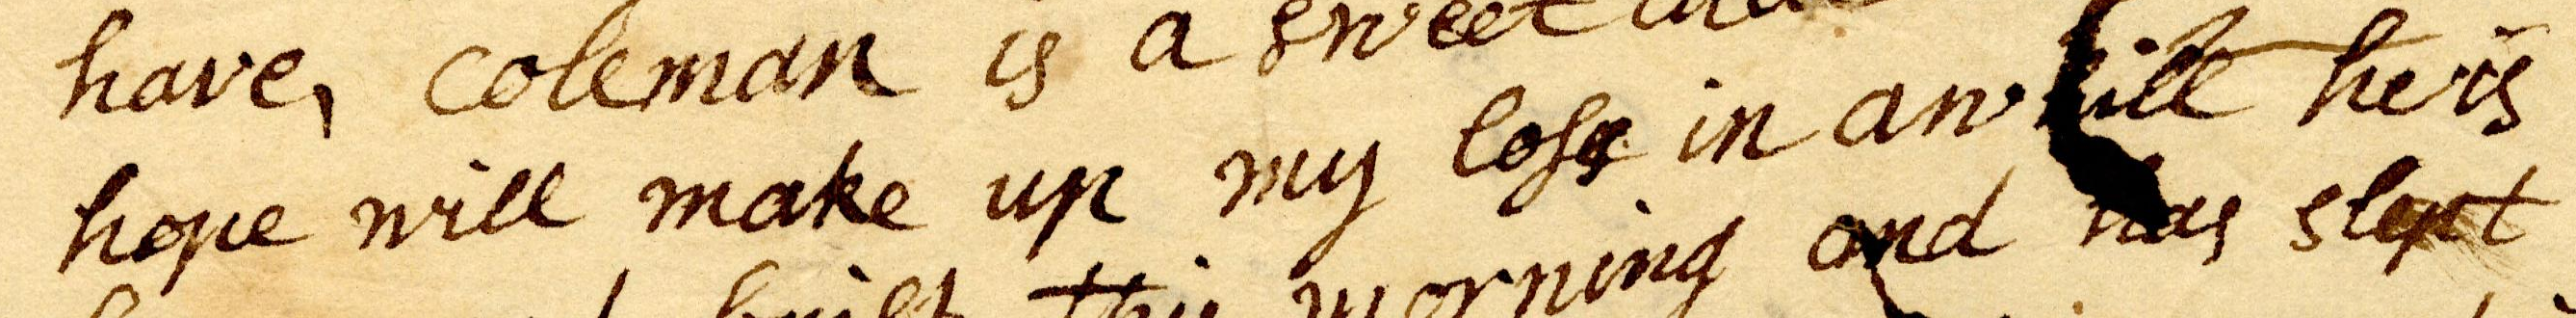hope will make up my loss in a while he is
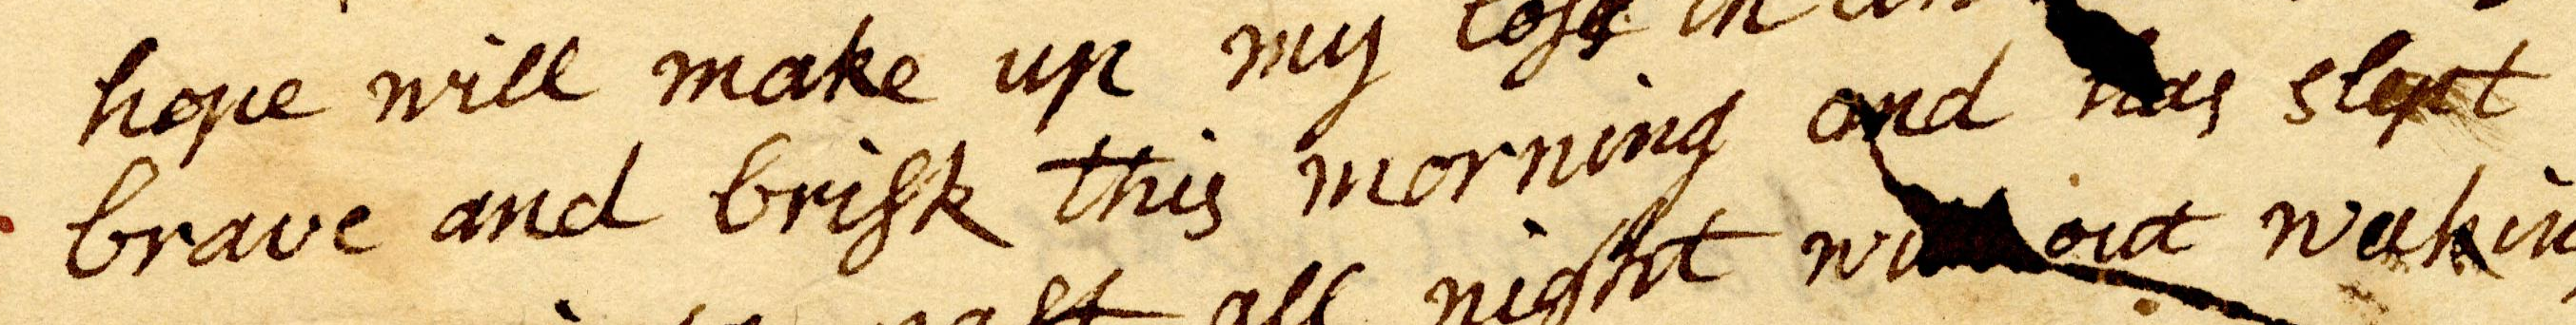brave and brisk this morning and has slept
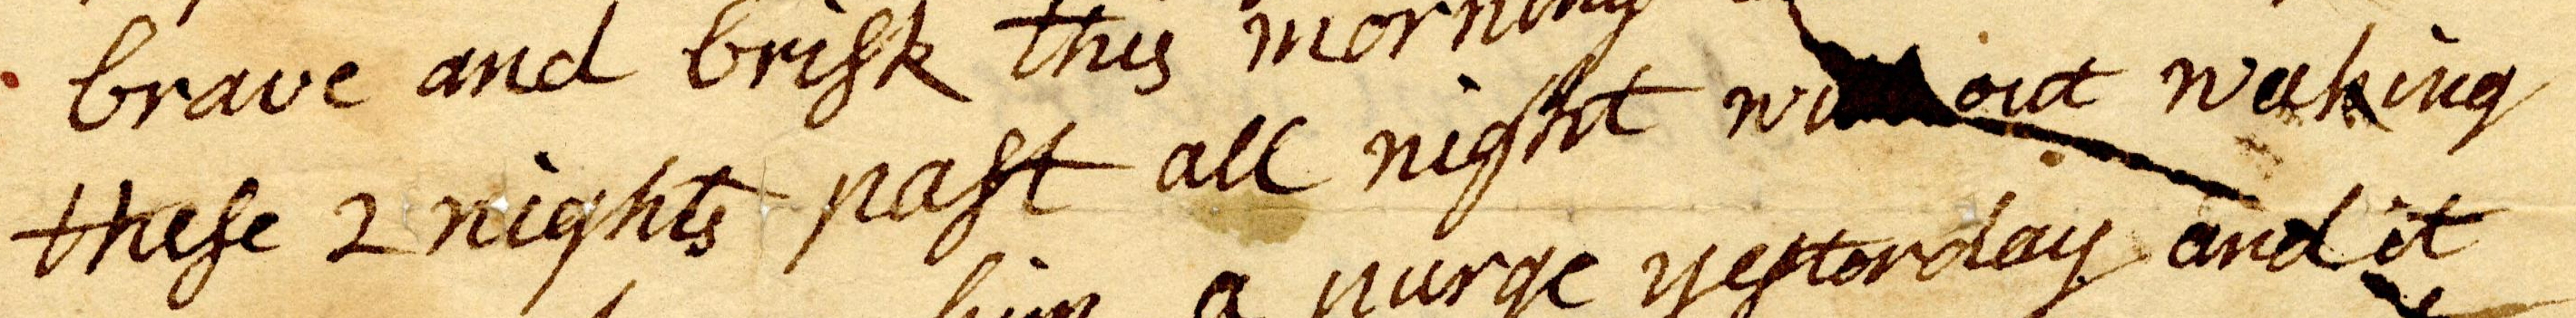these 2 nights past all night without waking
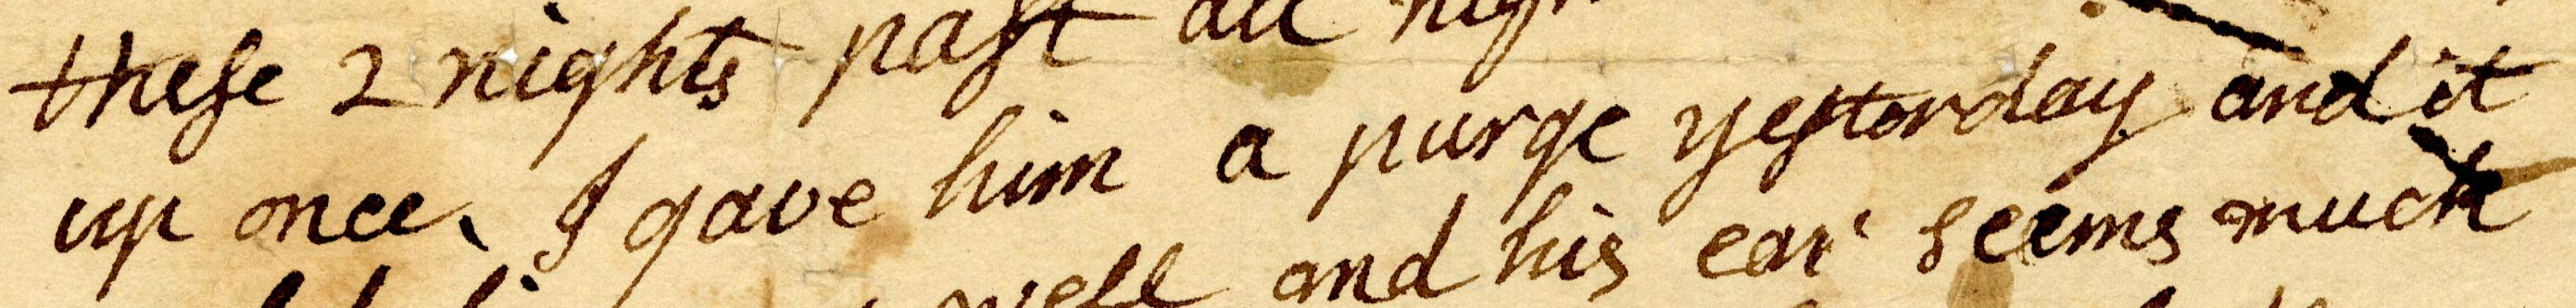up once, I gave him a purge yesterday and it
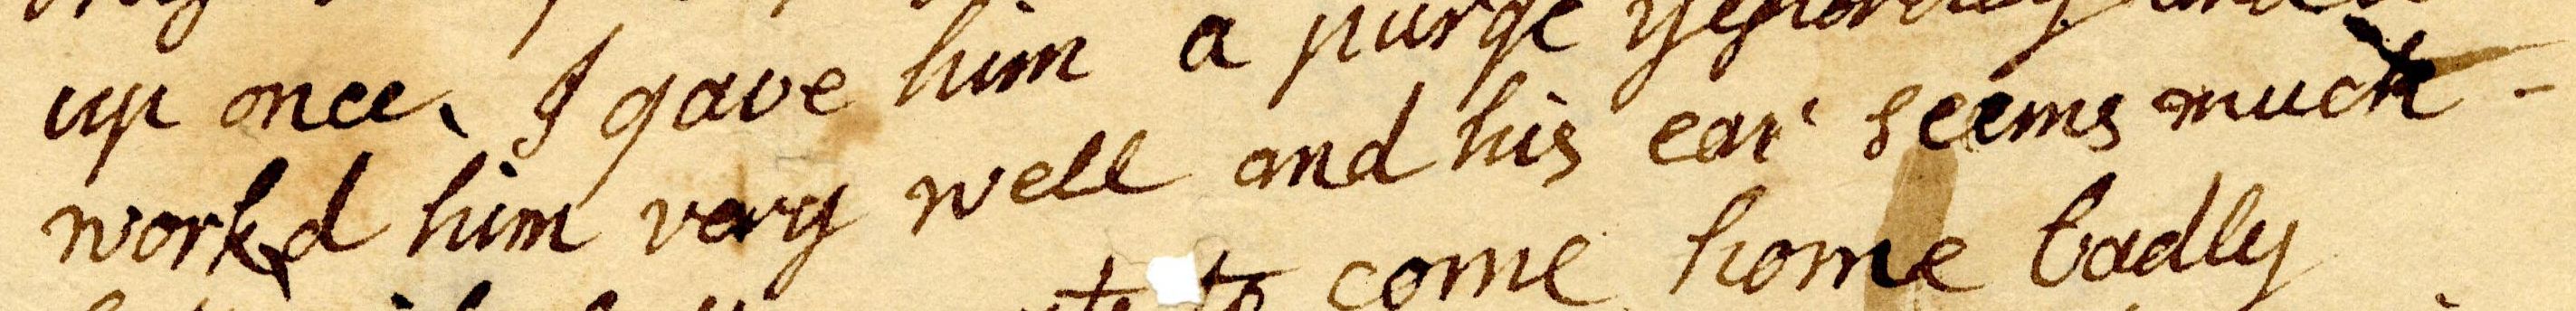work'd him very well and his ear seems much
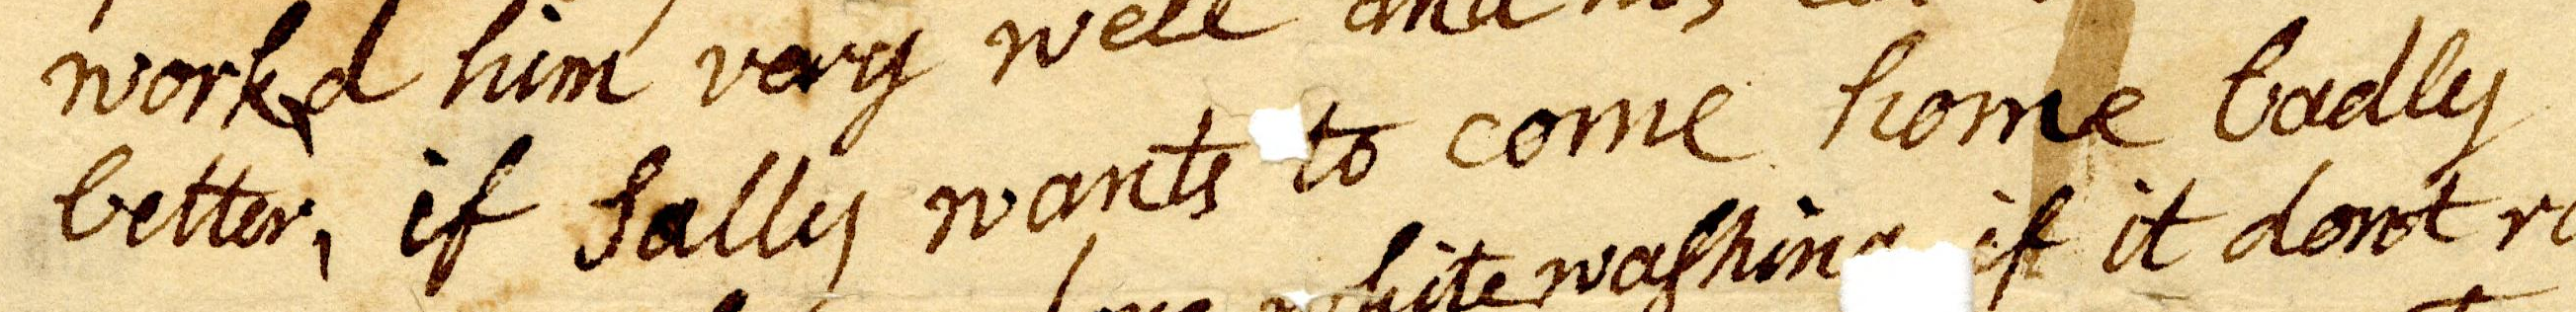better, if Sally wants to come home badly
